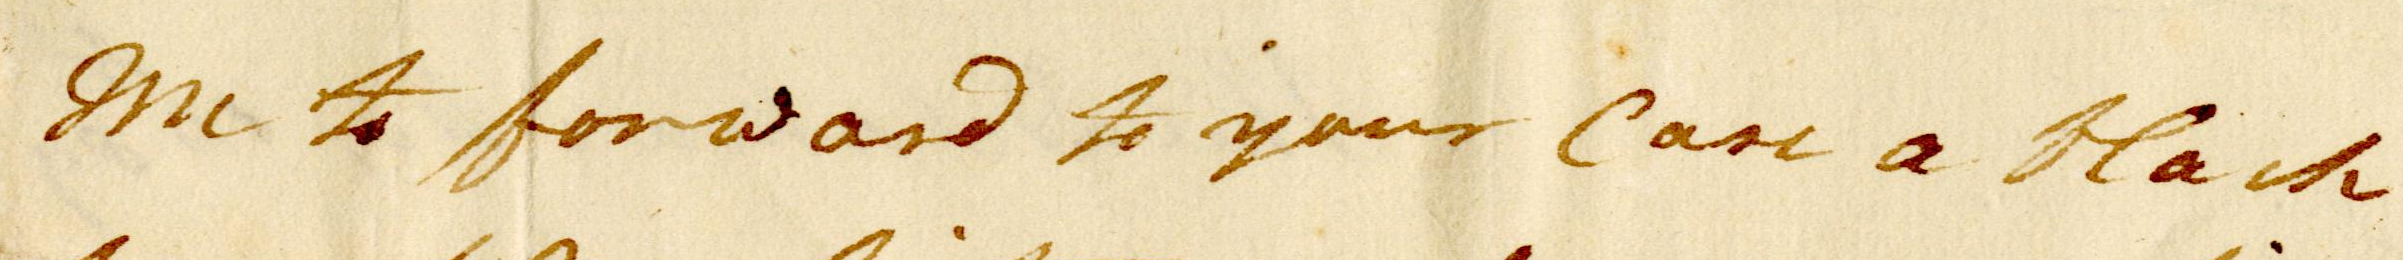Me to forward to your Case a black
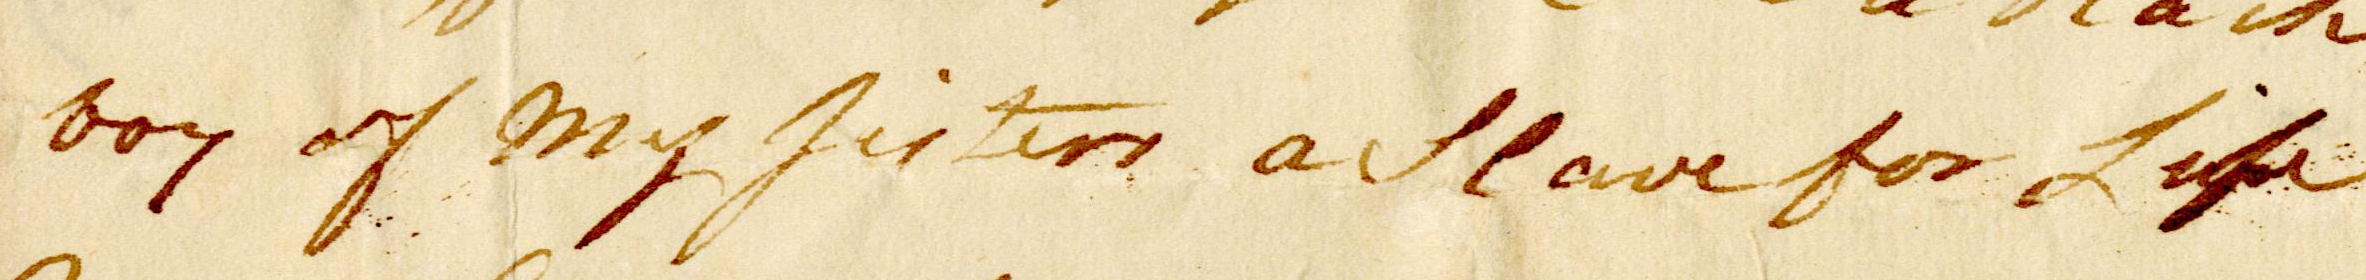boy of my sisters a Slave for life
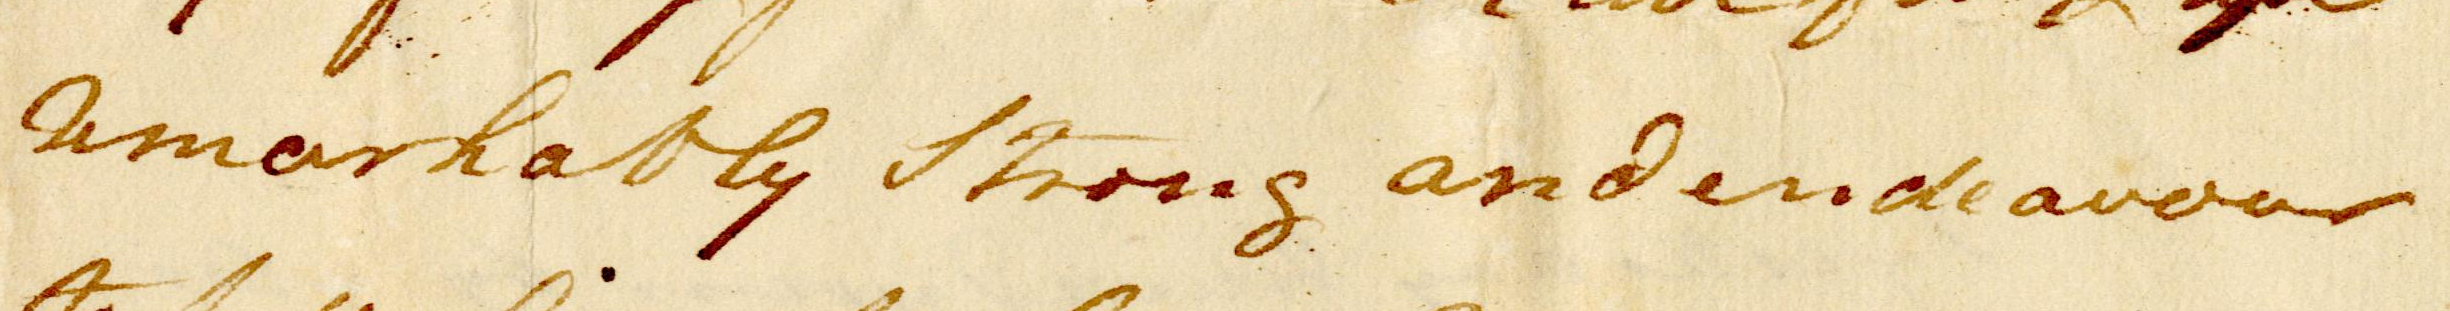remarkably Strong and endeavor
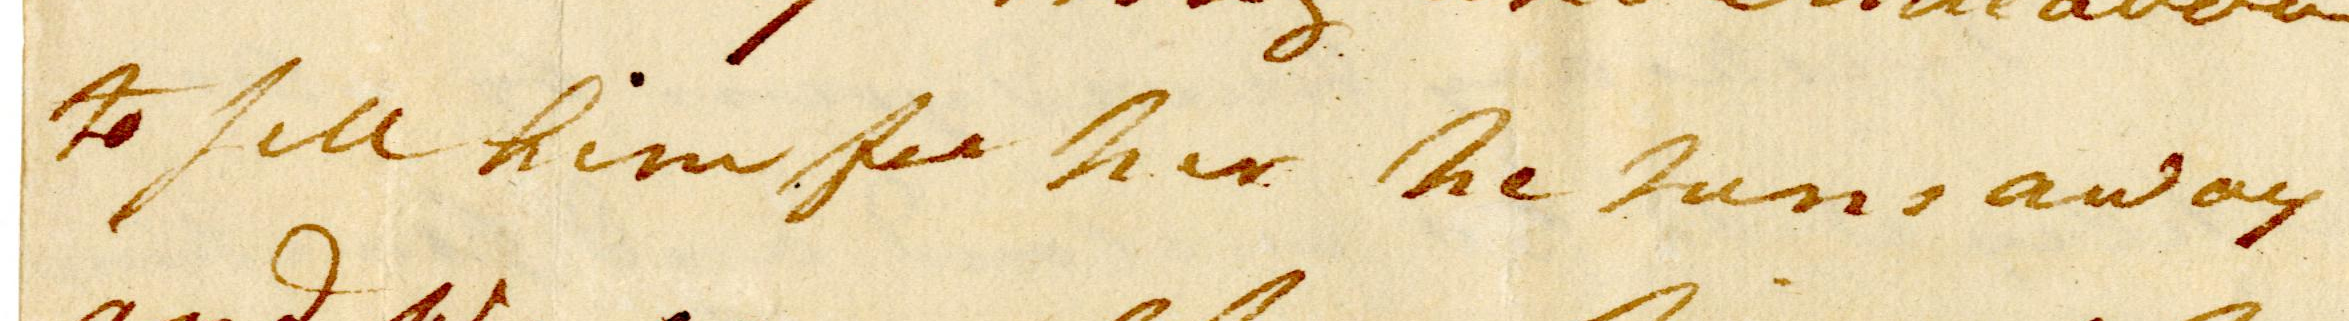to sell him for her he runs away
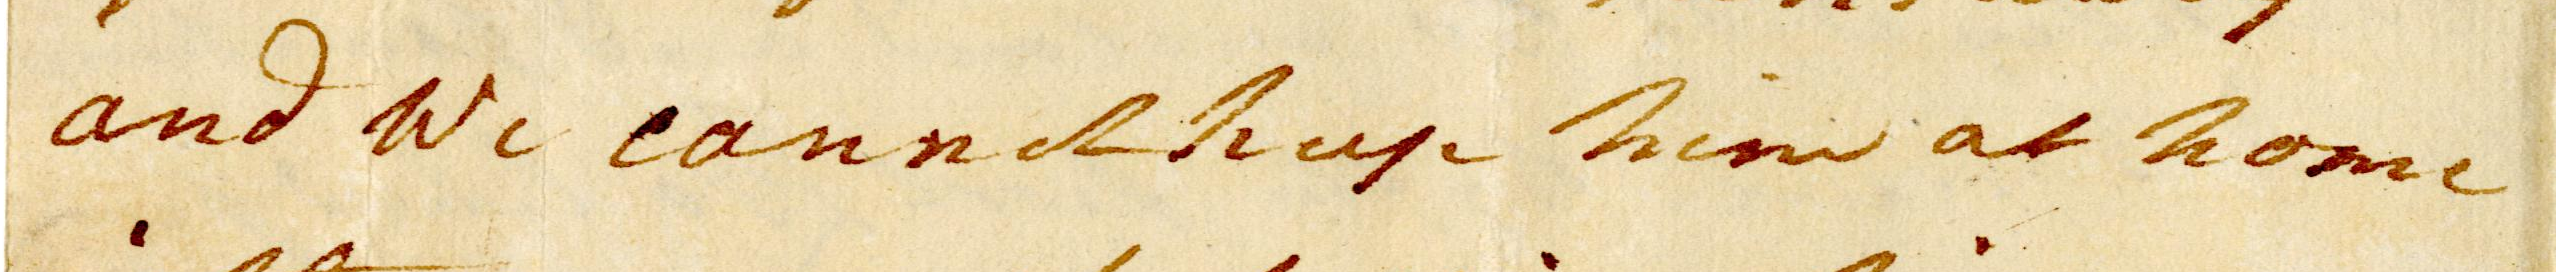and We cannot keep him at home
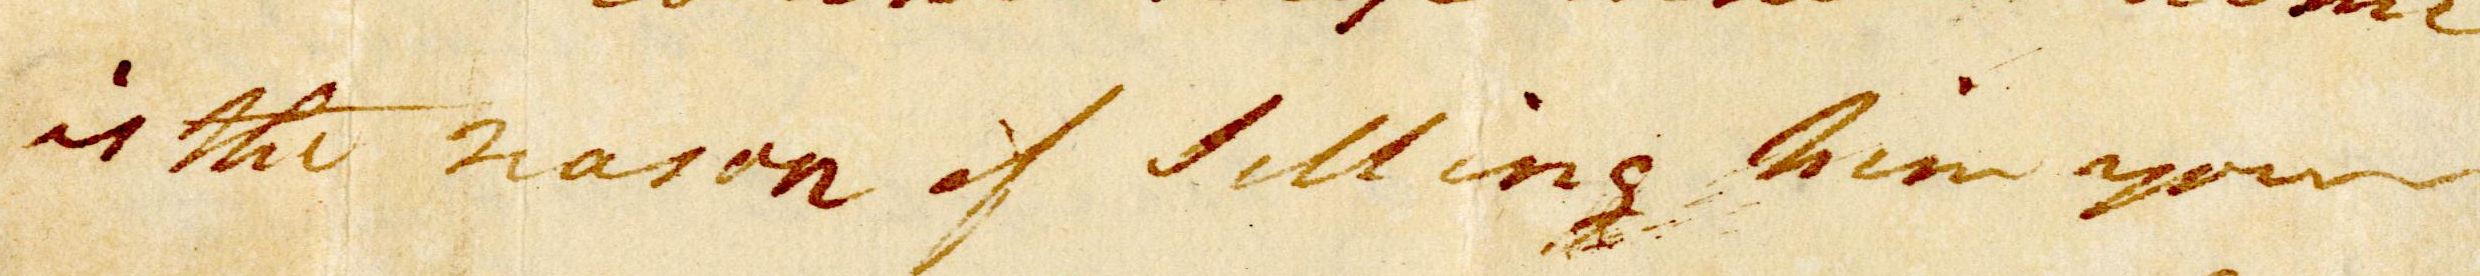is the reason of selling him your
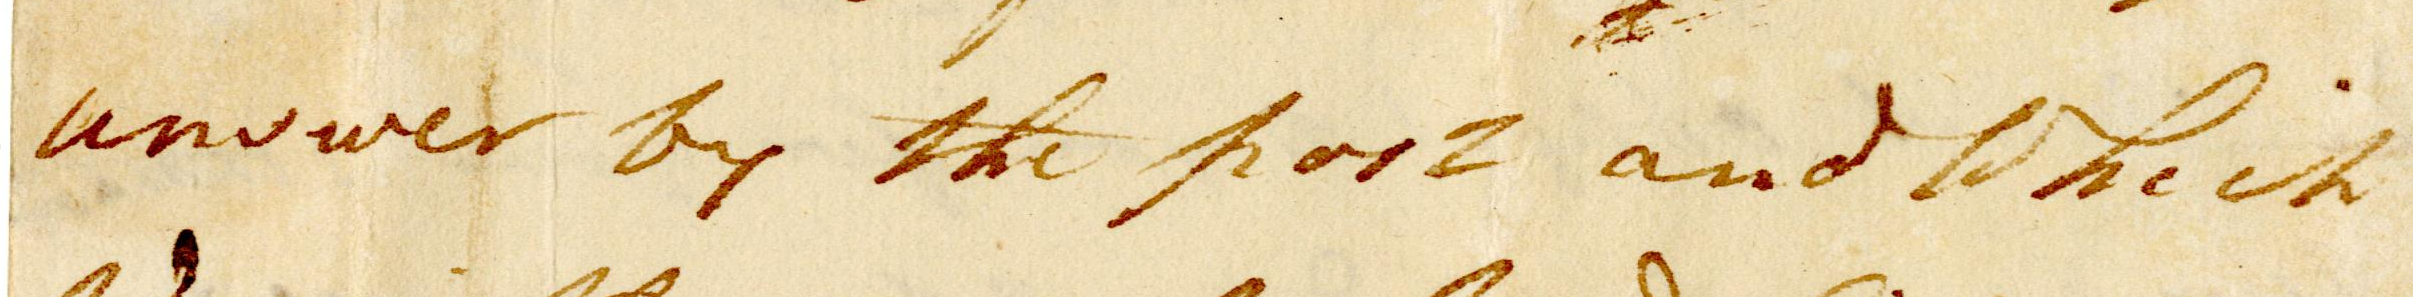answer by the post and which
